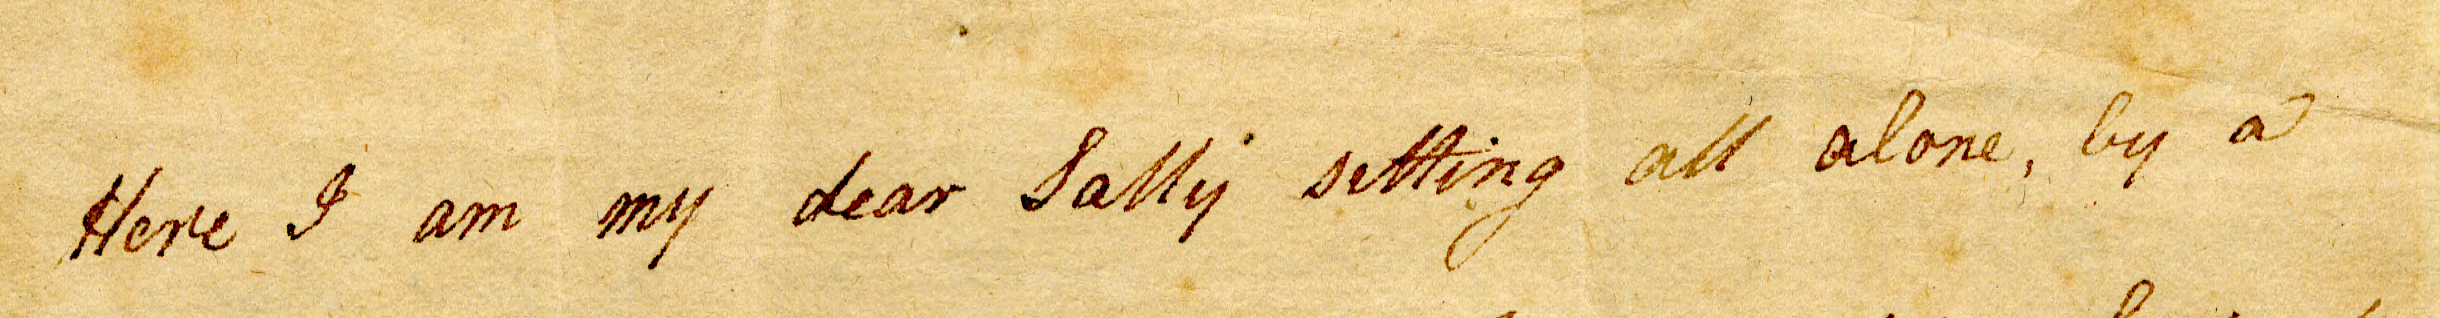Here I am my dear Sally sitting all alone, by a
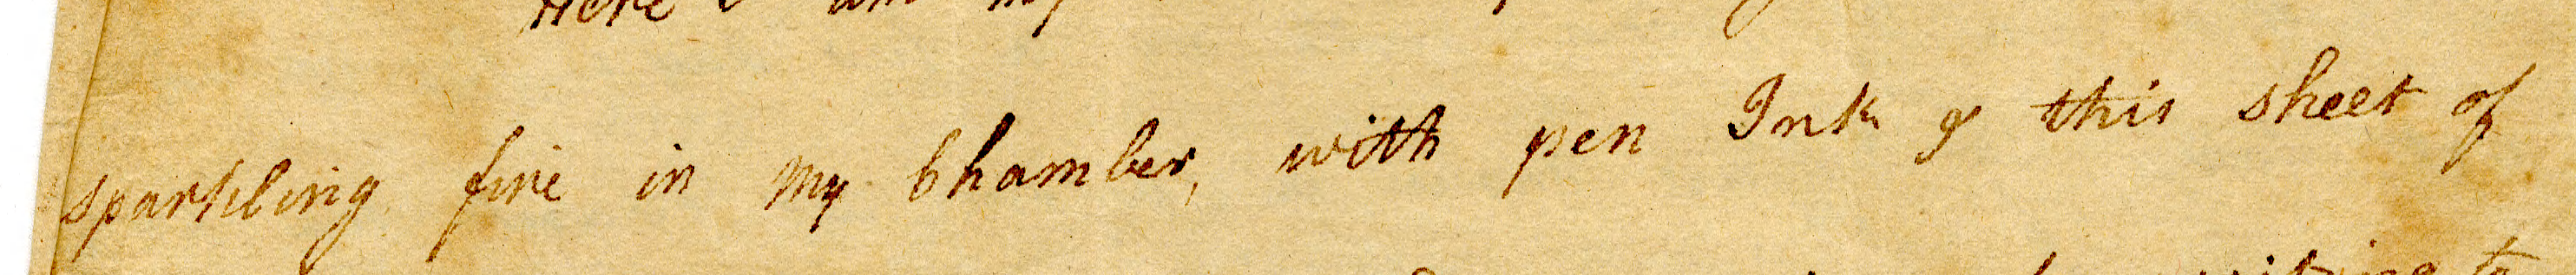sparkling fire in my chamber with pen Ink & this sheet of
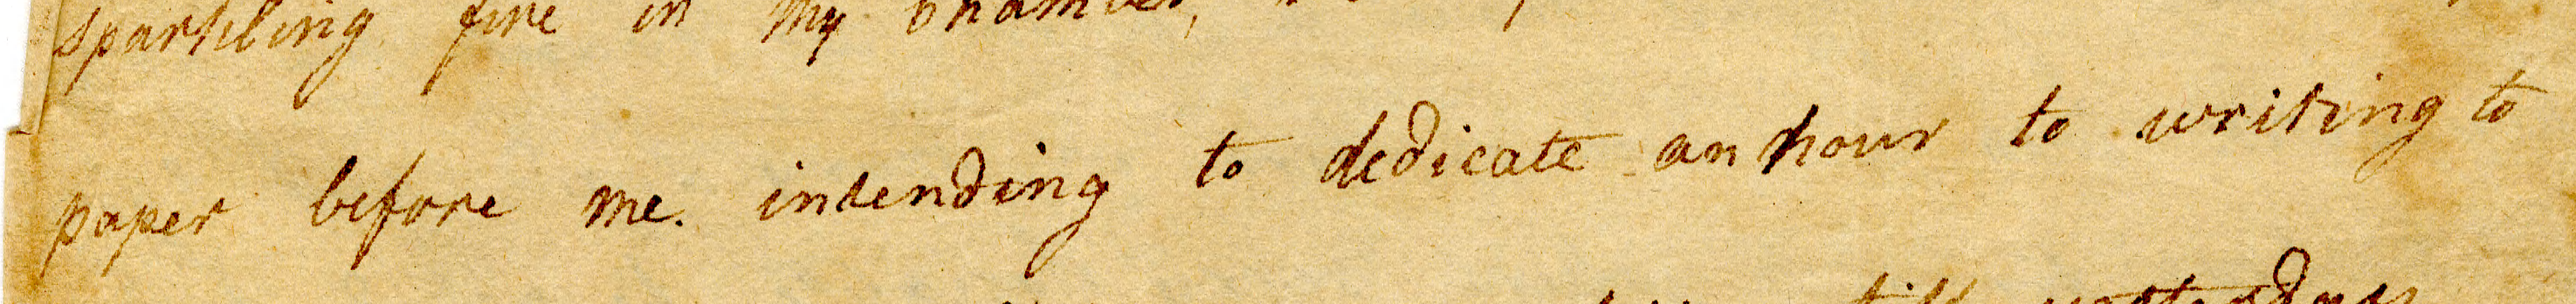paper before me intending to dedicate an hour to writing to
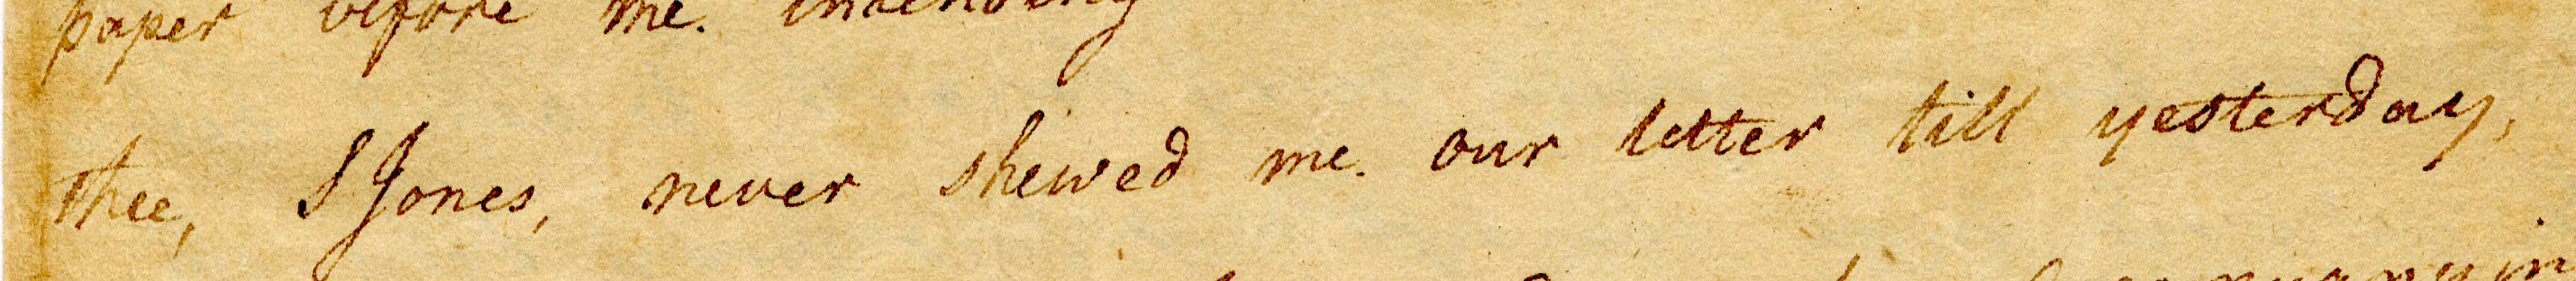thee, S Jones, never shewed me our letter till yesterday,
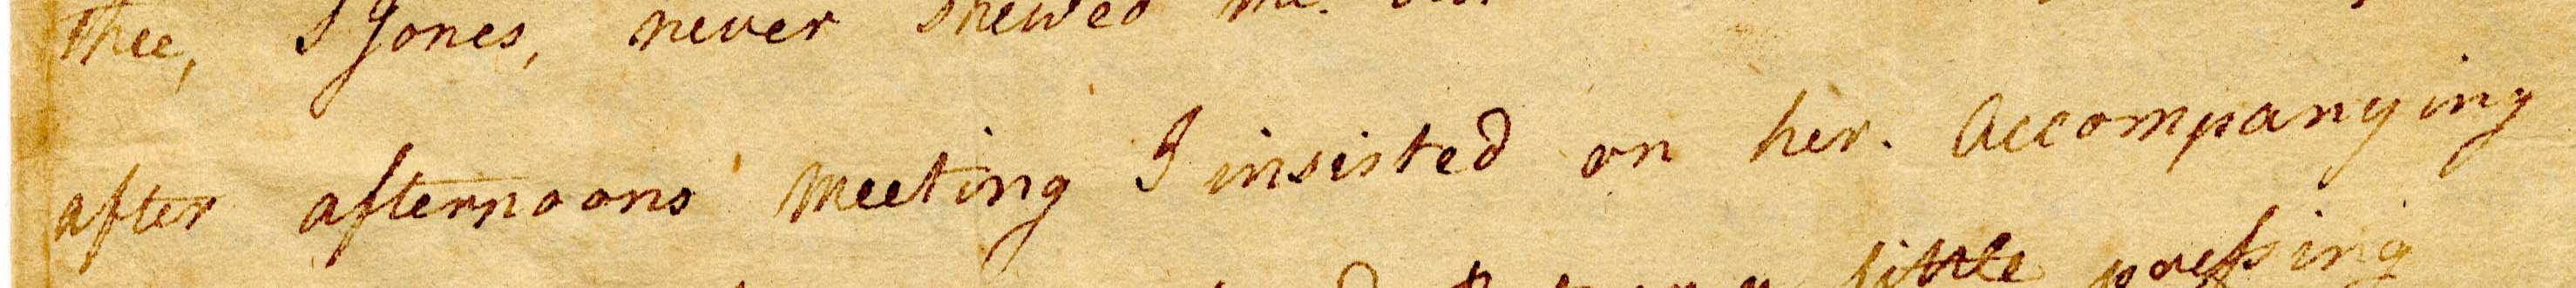after afternoons' meeting, I insisted on her accompanying
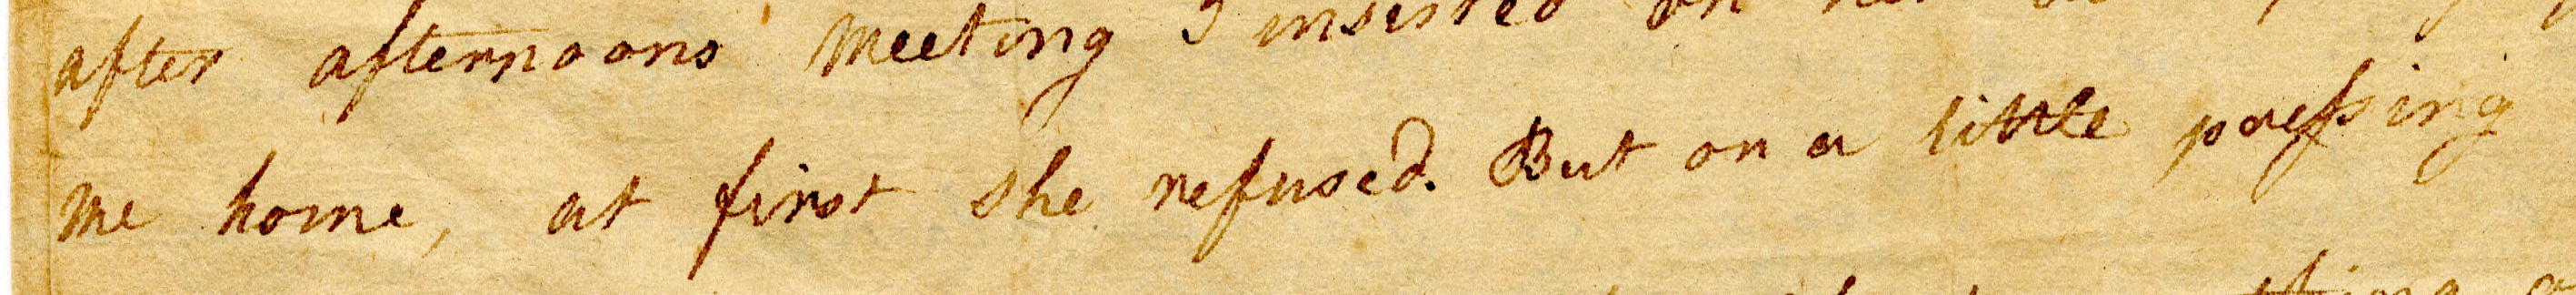me home, at first she refused. But on a little pressing
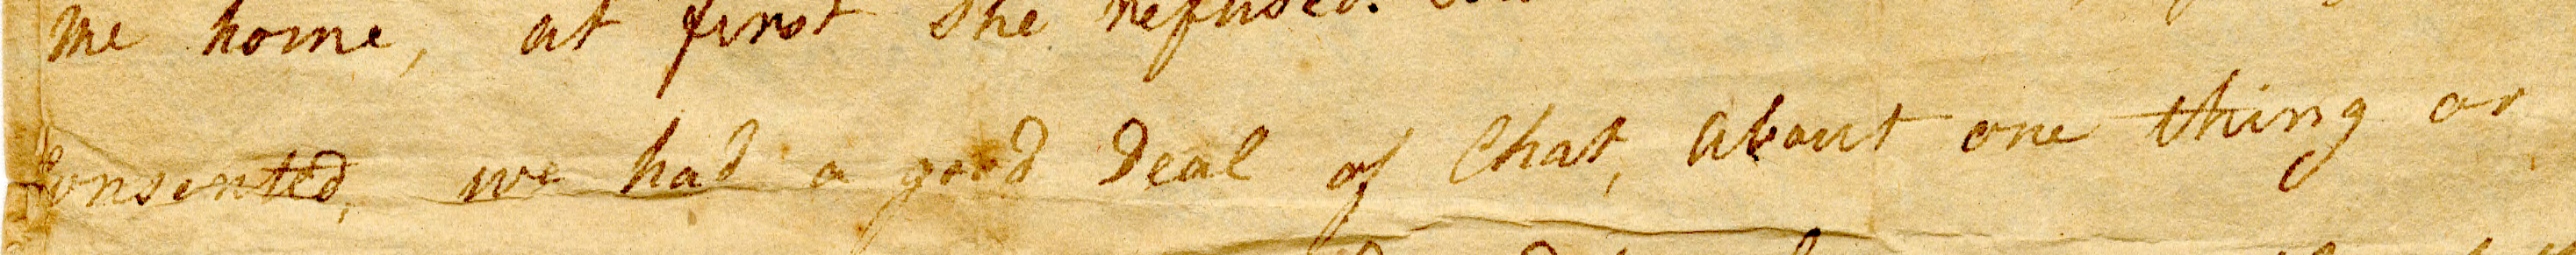Consented, we had a good deal of Chat about one thing or
